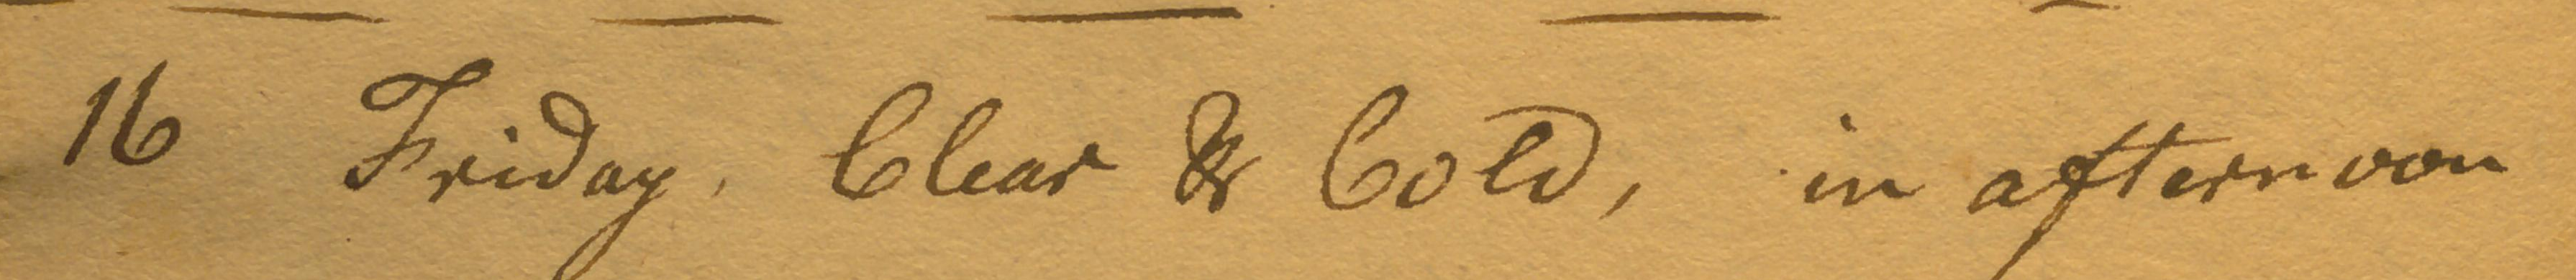16 Friday. Clear & Cold, in afternoon
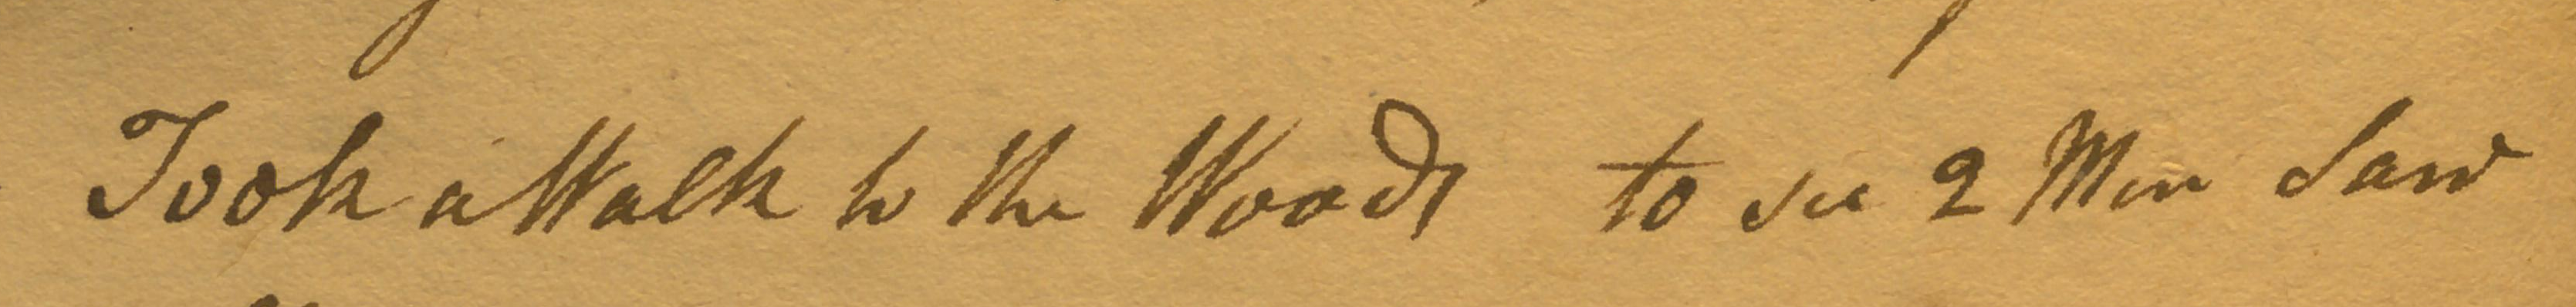Took a Walk to the Woods to see 2 Men Saw
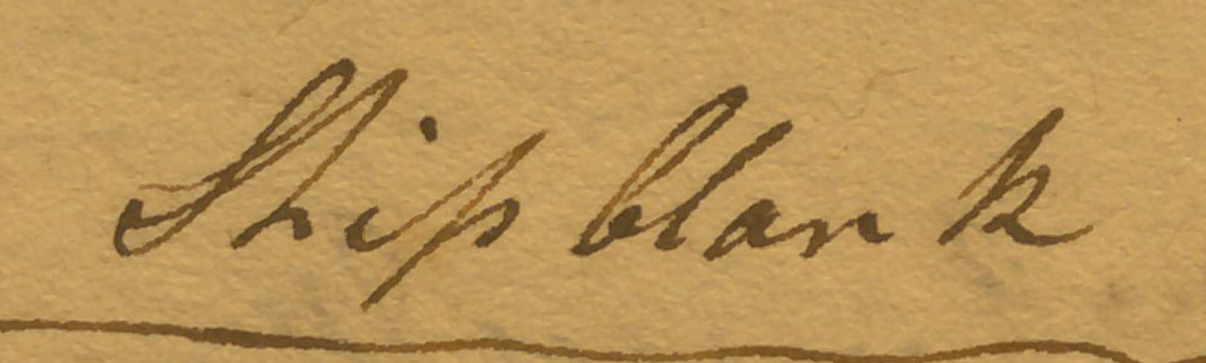Ship blank
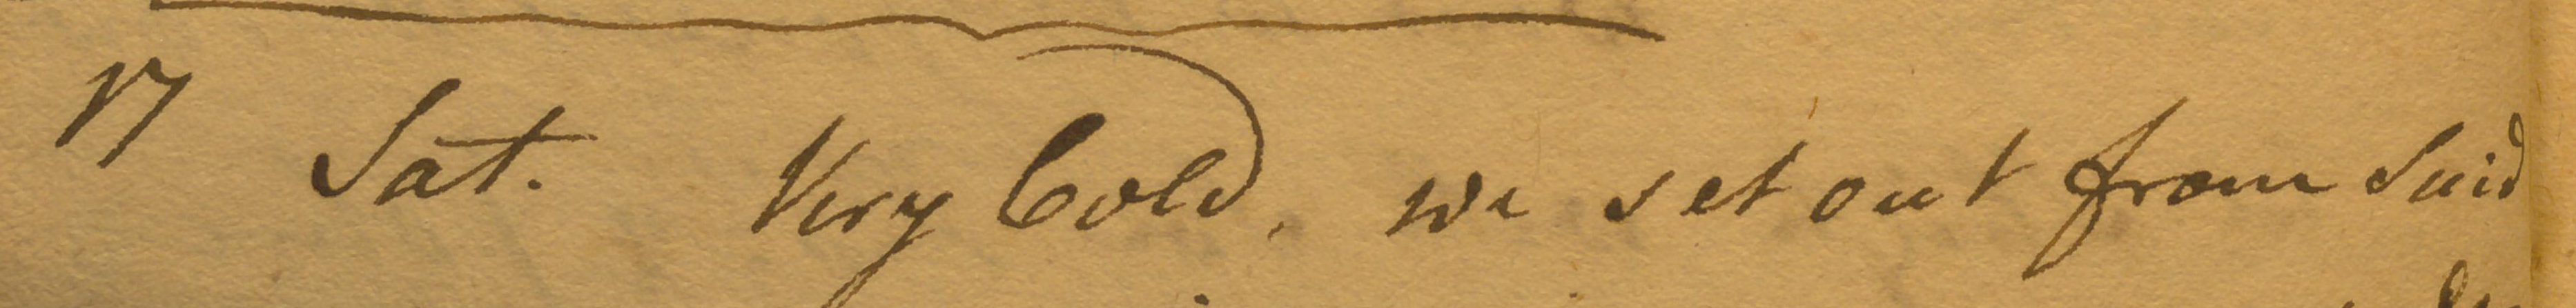17 Sat. Very Cold, we set out from said
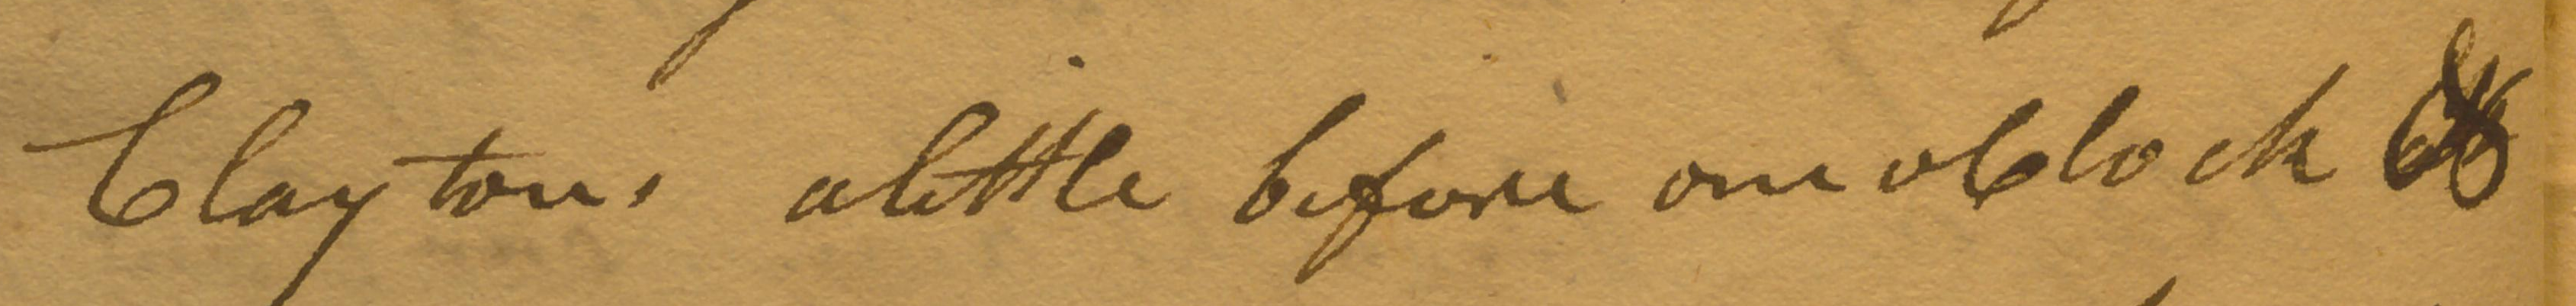Claytons a little before one oClock &
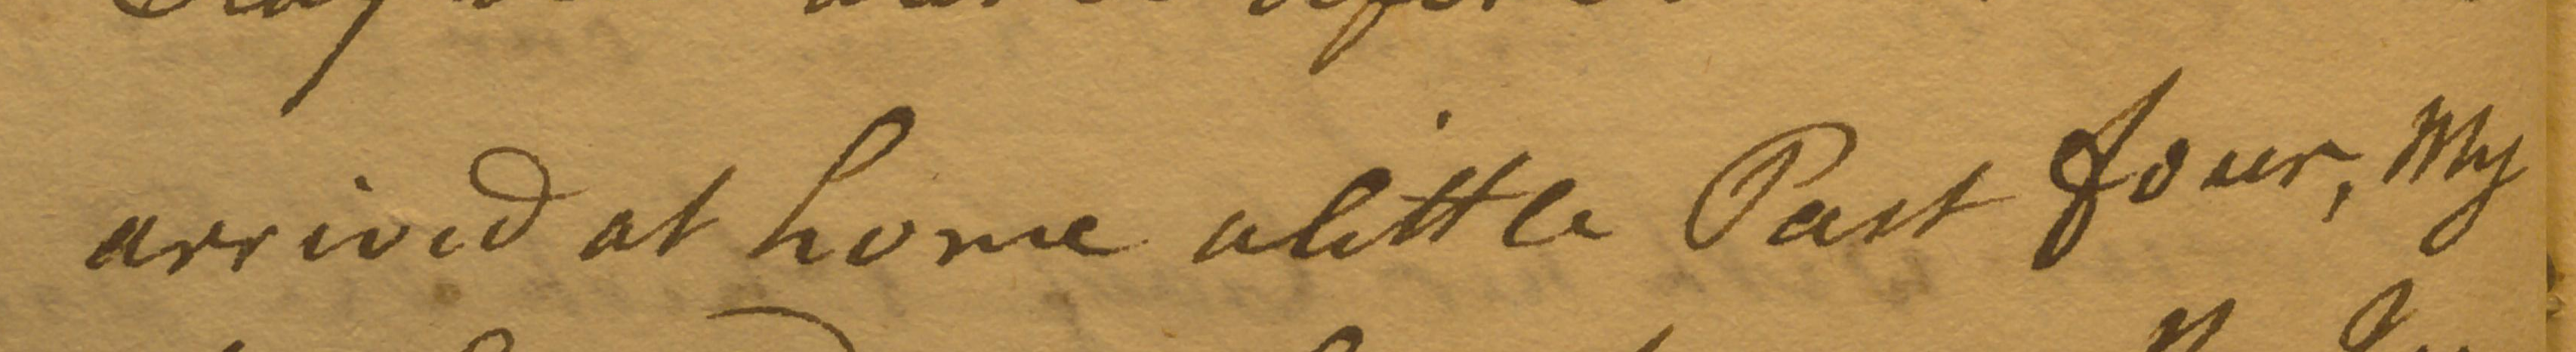arrived at home a little Past four, My
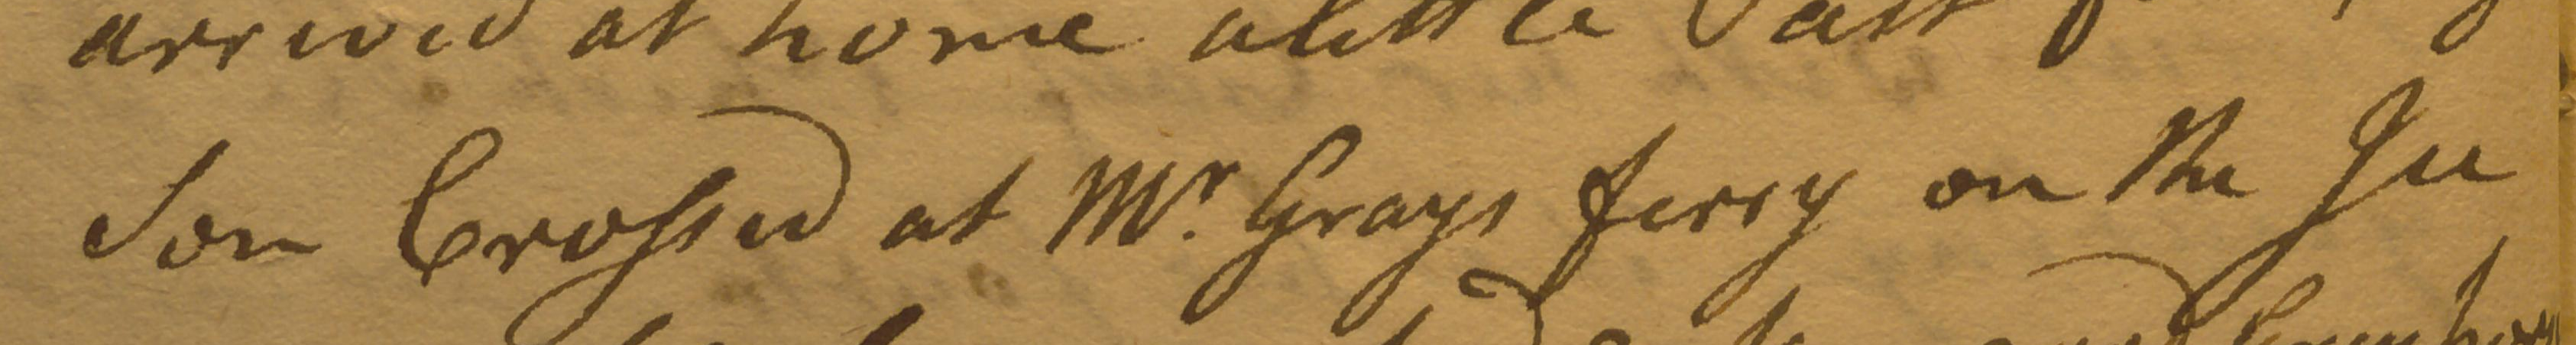Son Crossed at M^r. Grays ferry on the Ice
